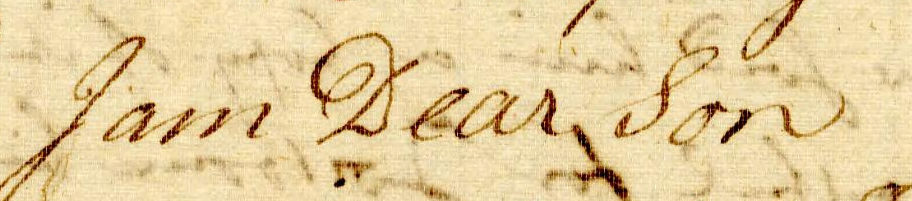I am Dear Son
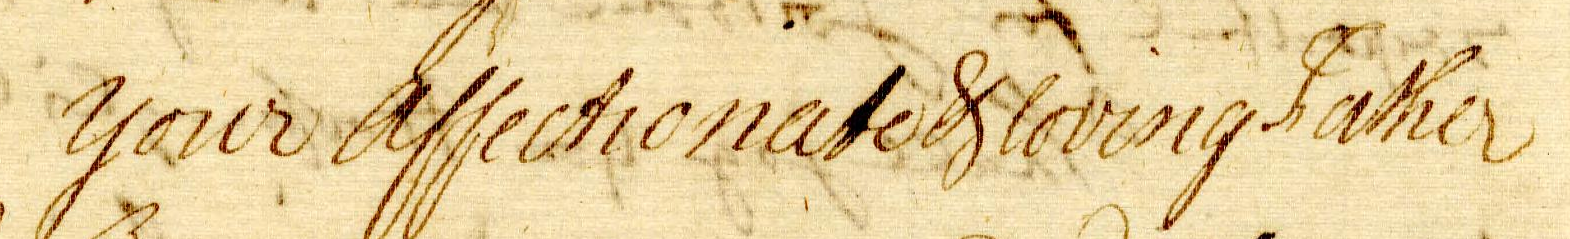Your Affectionate & loving Father
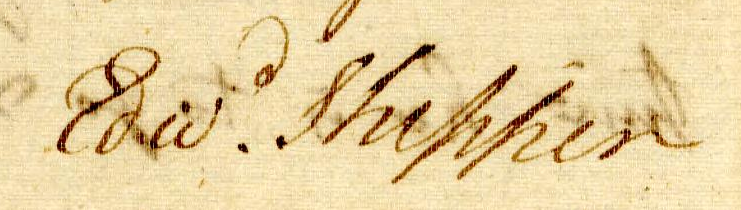Edw^d. Shippen
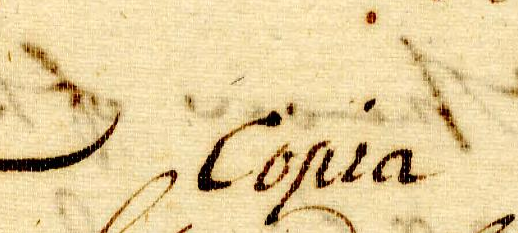Copia
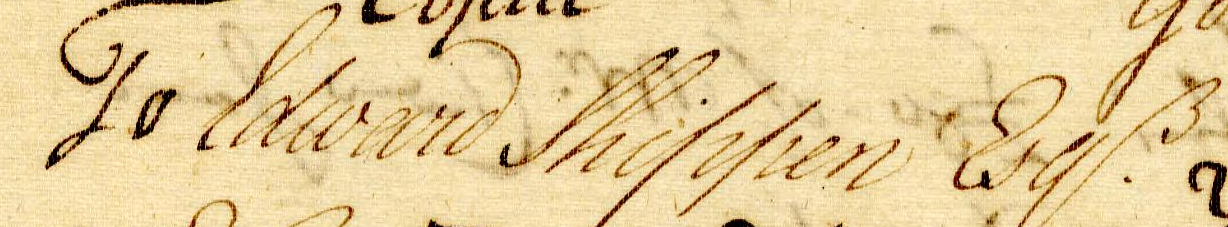To Edward Shippen Esq^r.
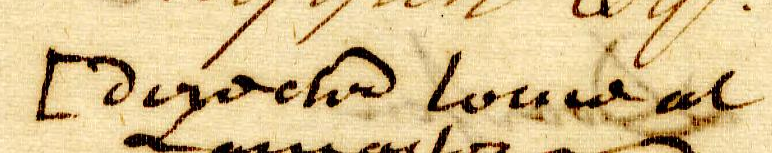(derected house at
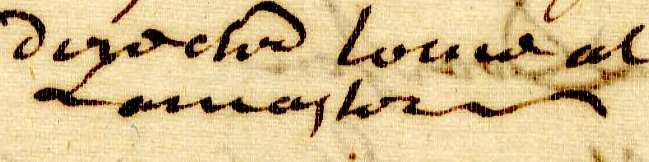Lancaster
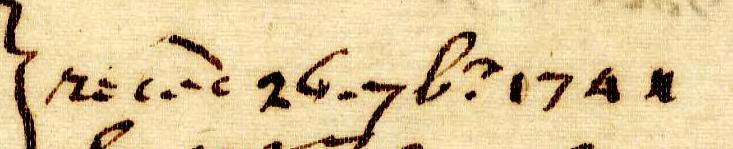rec^d 26. 7b^r. 1744
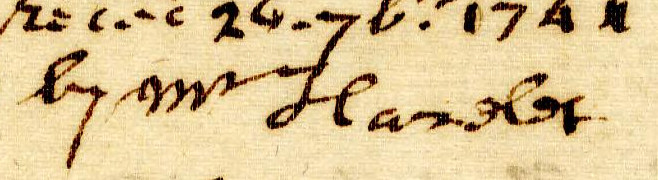by M^r Hander
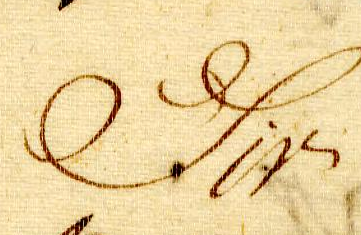Sir
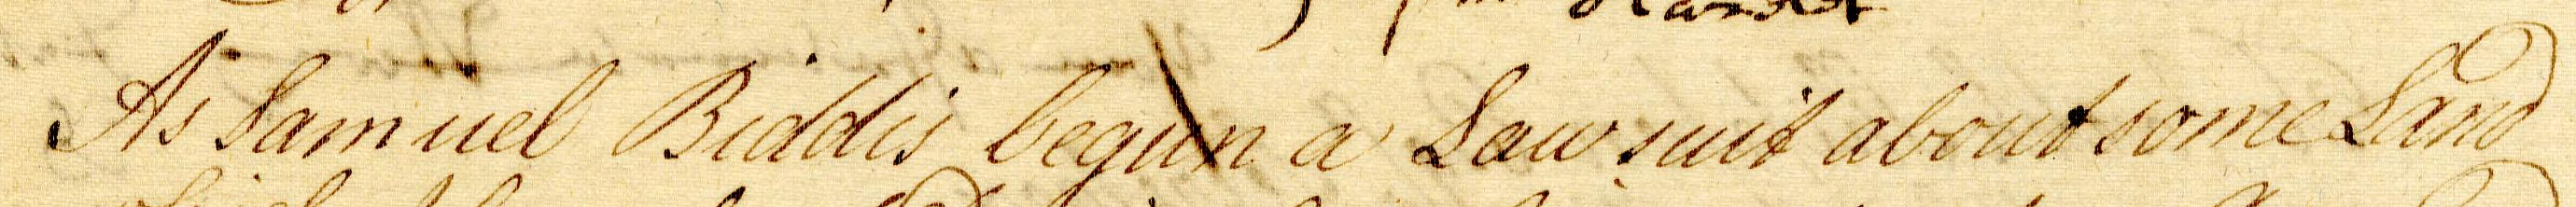As Samuel Biddis begun a Lawsuit about some Land
